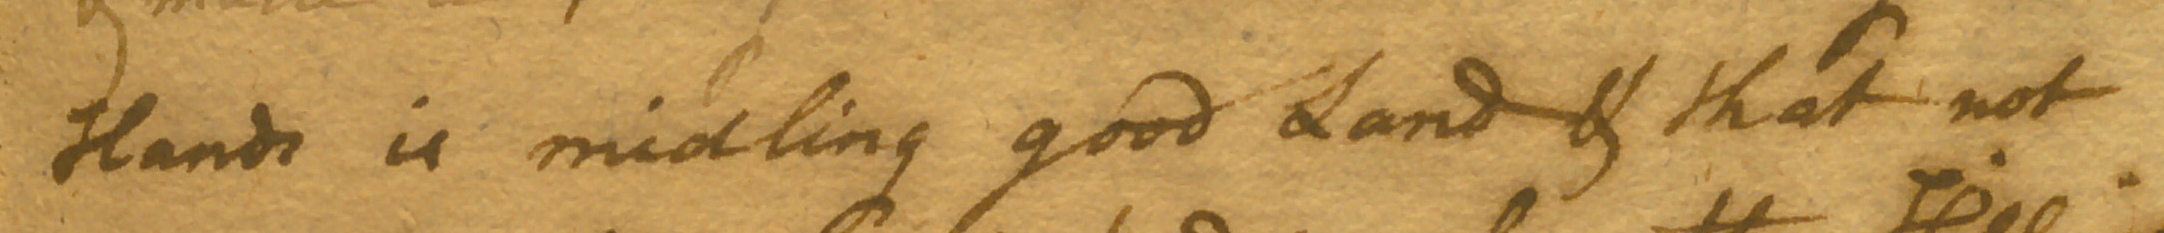Hands is middling good Land & that not
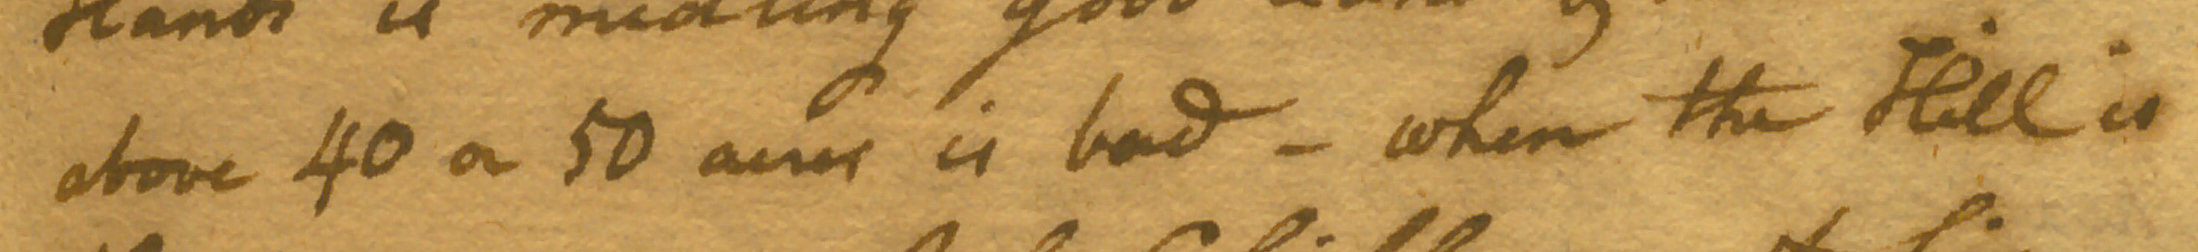above 40 or 50 acres is bad- when the Hill is
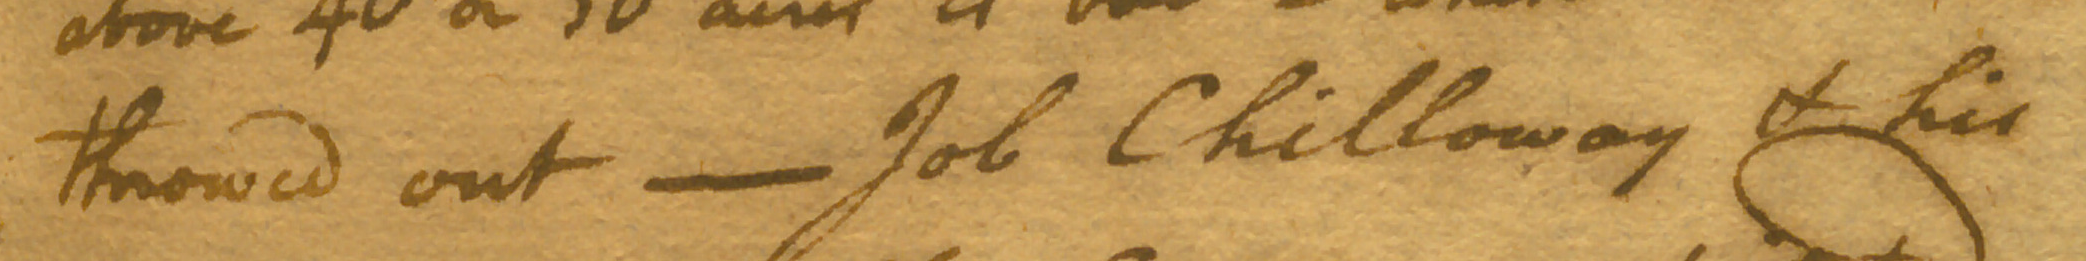thawed out- Job Chilloway & his wife
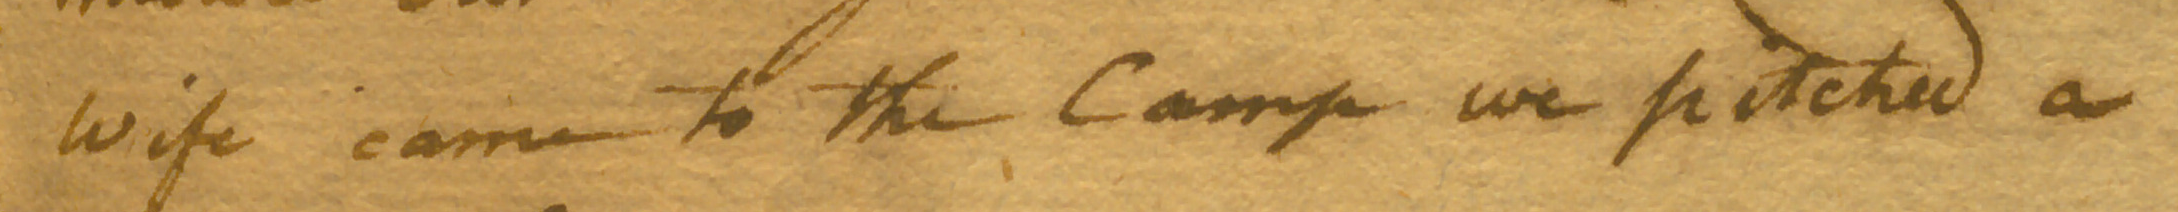wife came to the Camp we pitched a
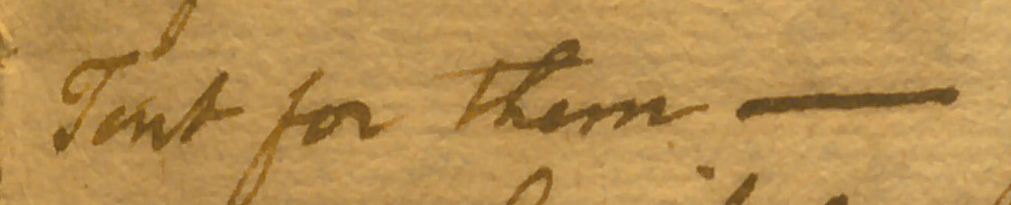Tent for them-
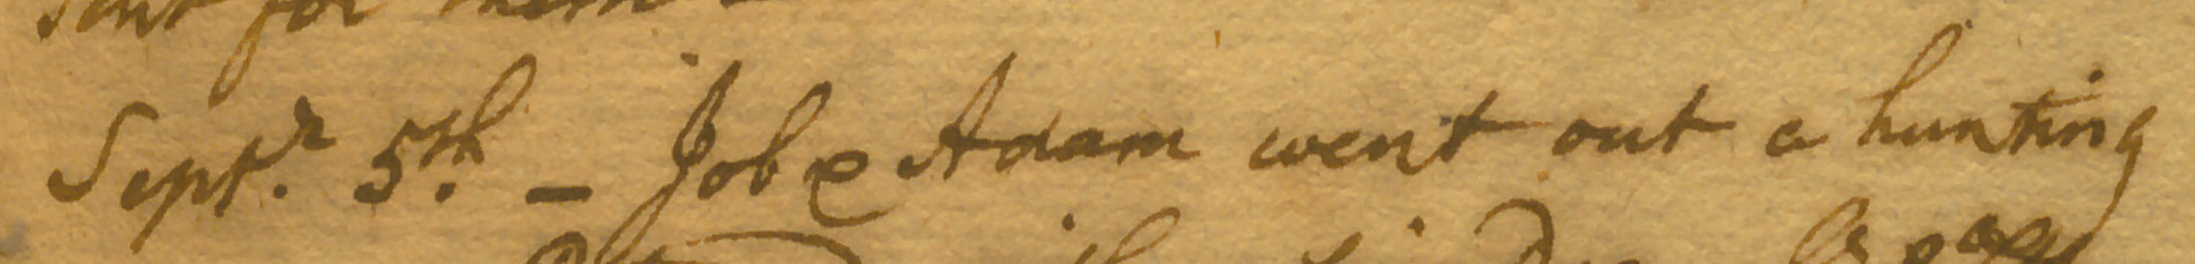Sept^r. 5^th.- Job & Adam went out a hunting
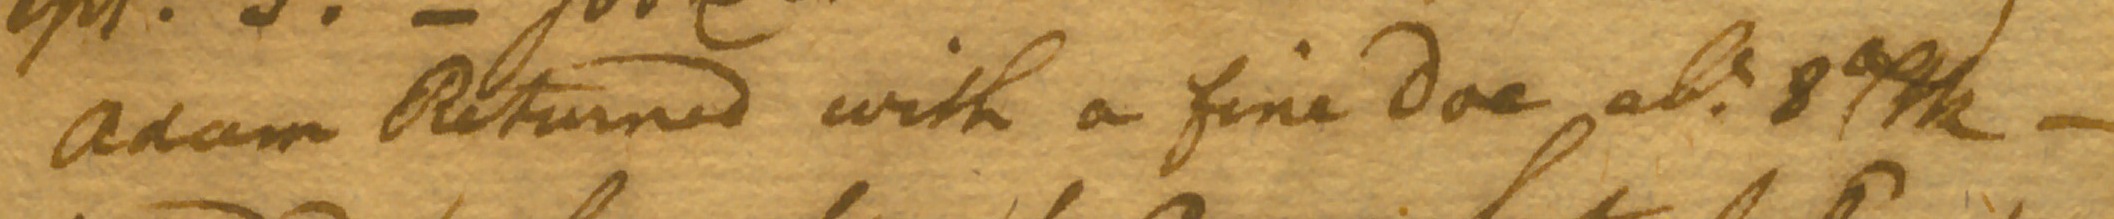Adam Returned with a fine doe ab^t. 8 ^oClk-
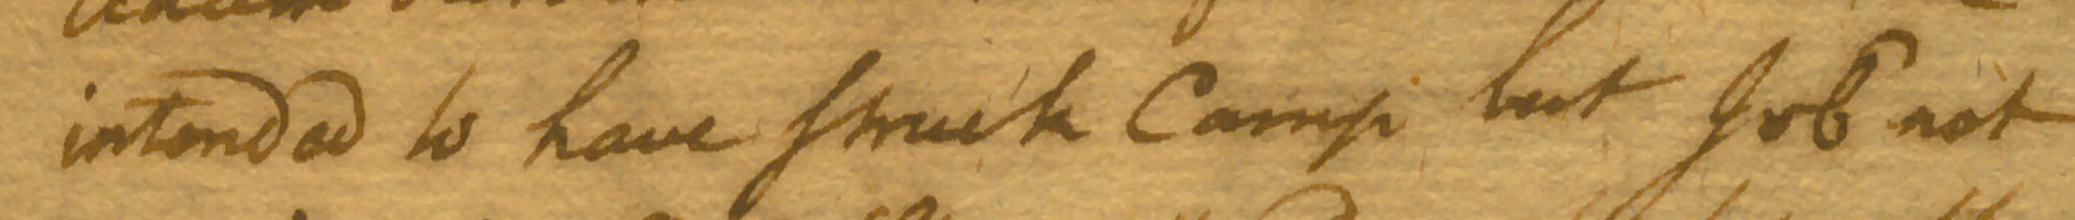indended to have struck Camp but Job not
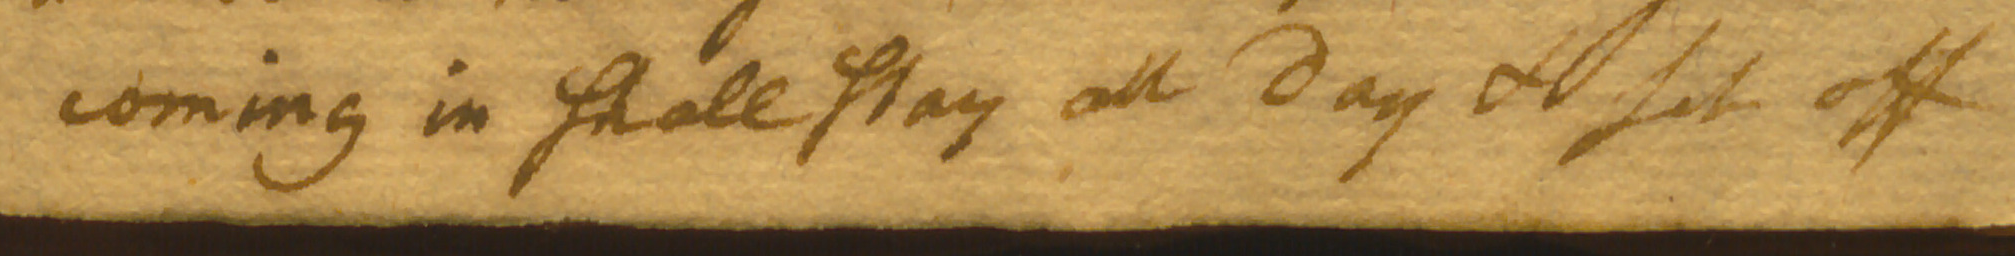coming in shall stay all day & set off
